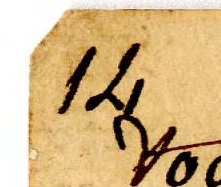14
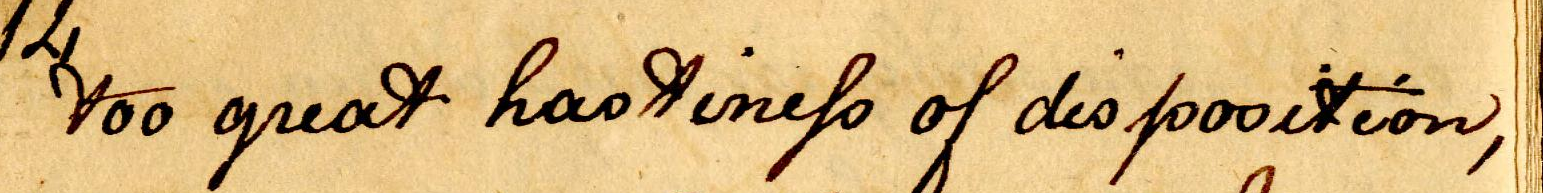too great hastiness of disposition,
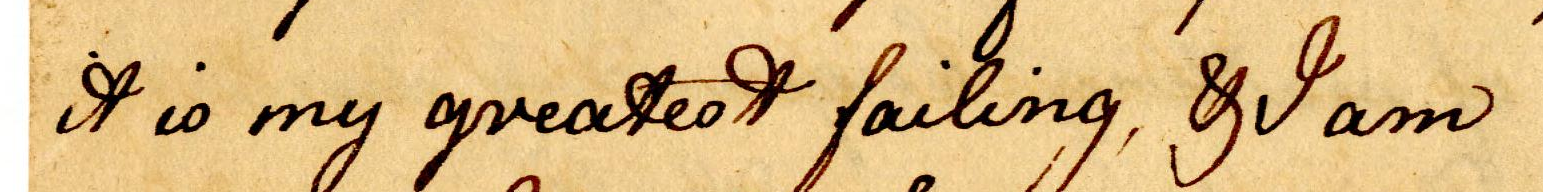it is my greatest failing, & I am
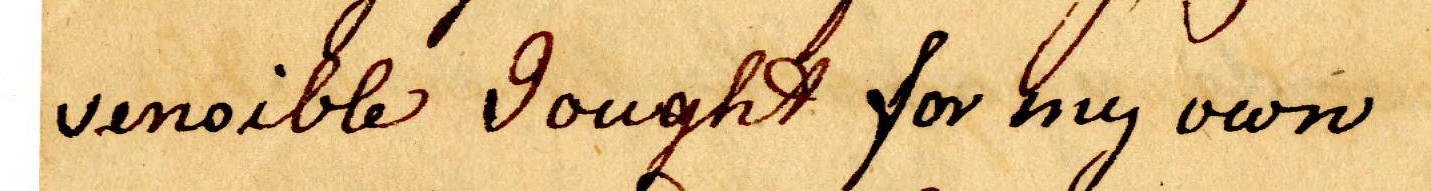sensible I ought for my own
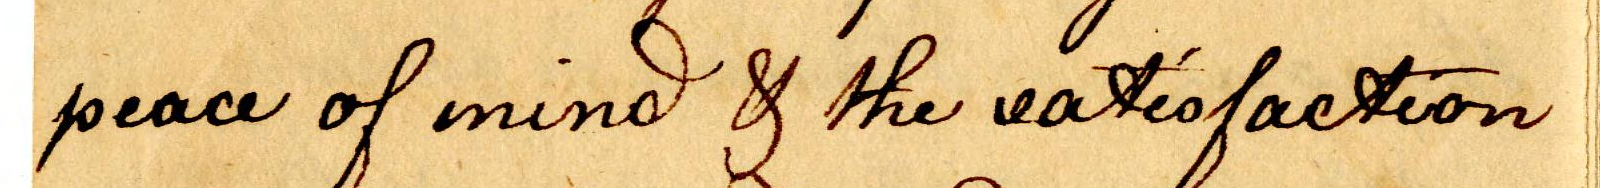peace of mind & the satisfaction
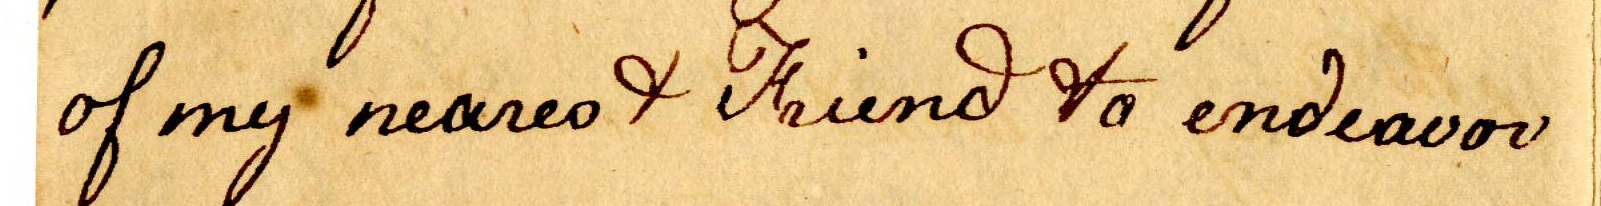of my nearest Friend to endeavour
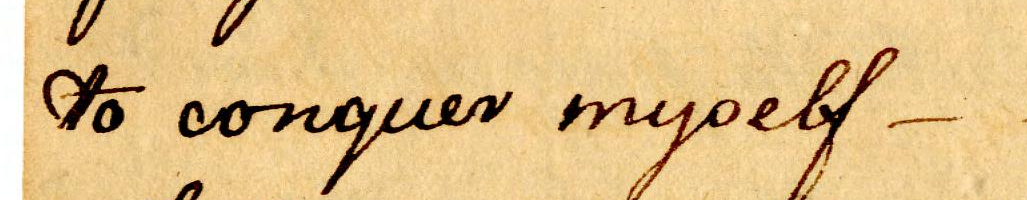to conquer myself-
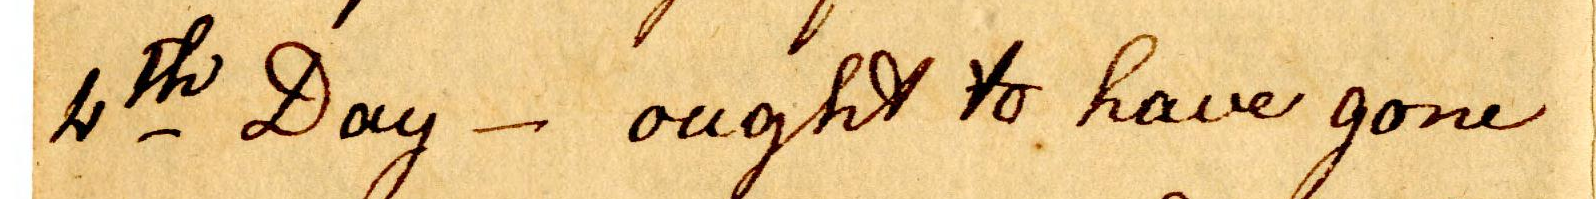4^th Day- ought to have gone
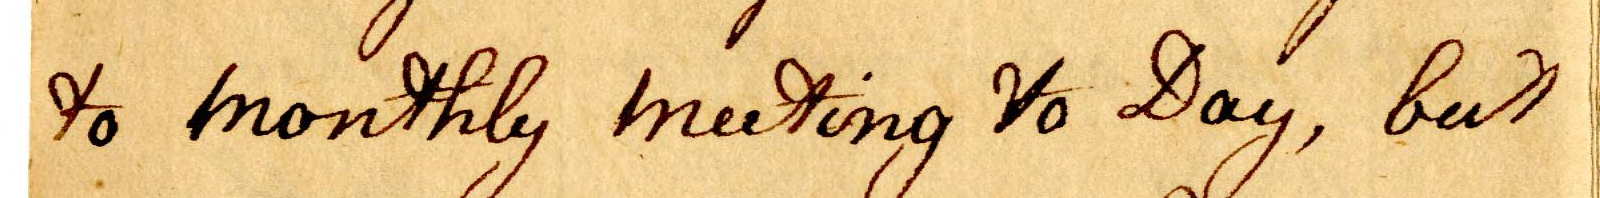to monthly meeting to Day, but
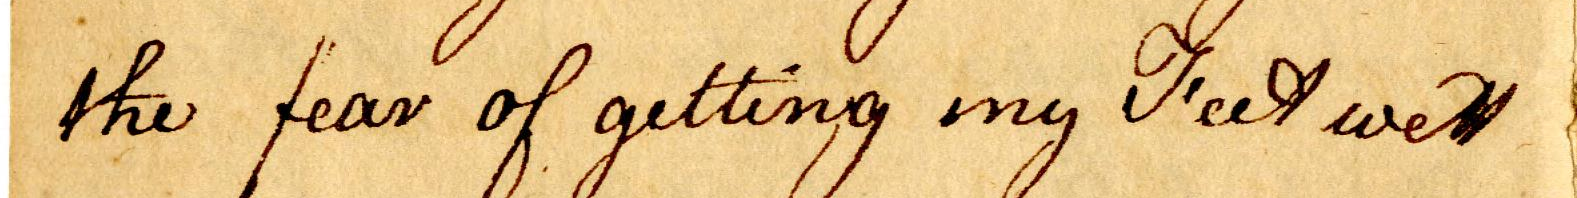the fear of getting my Feet wett
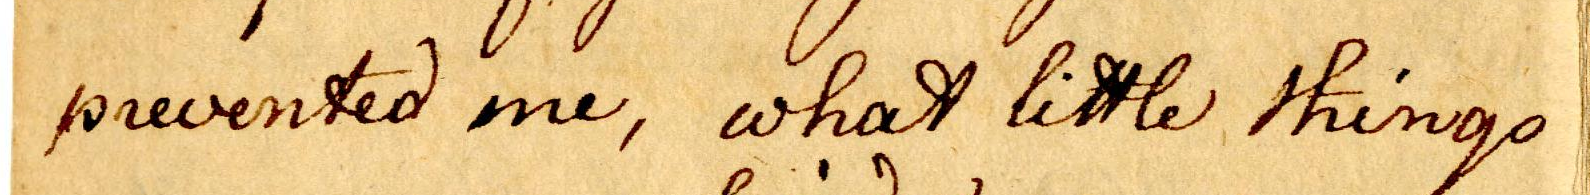prevented me, what little things
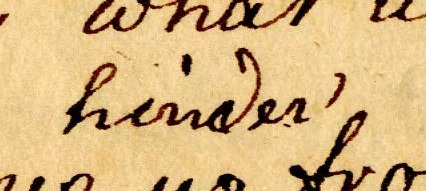hinder'
